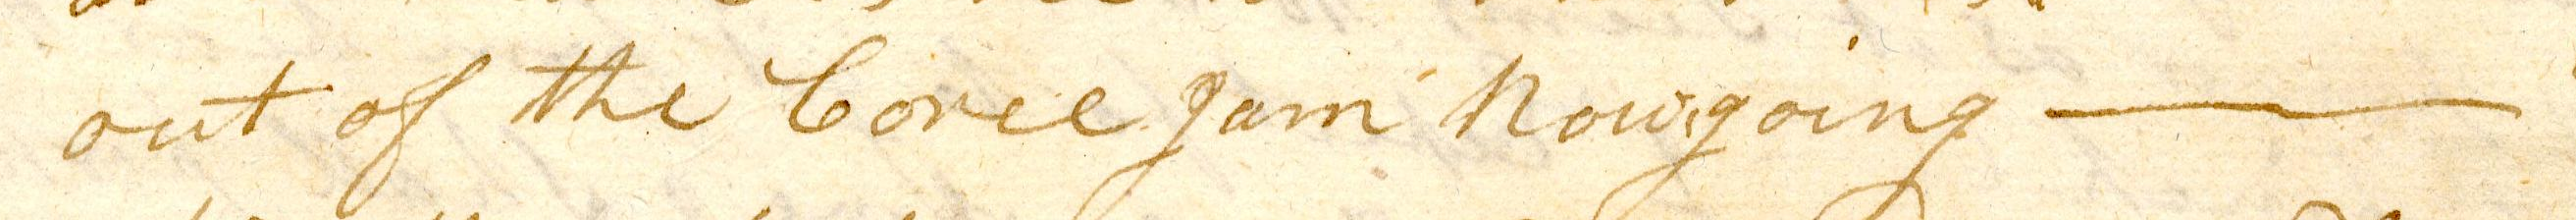out of the Corse I am Now going-
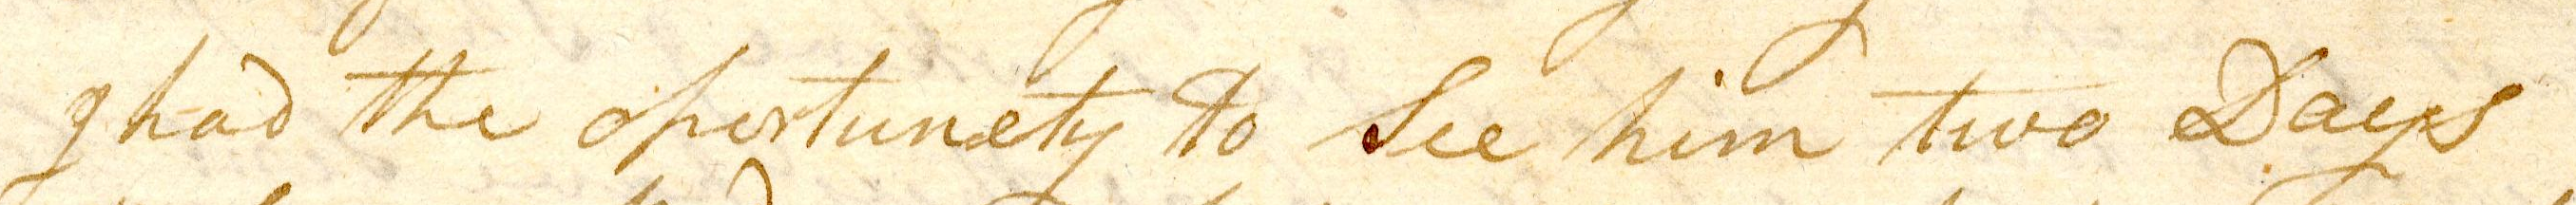I had the opertunety to See him two Days
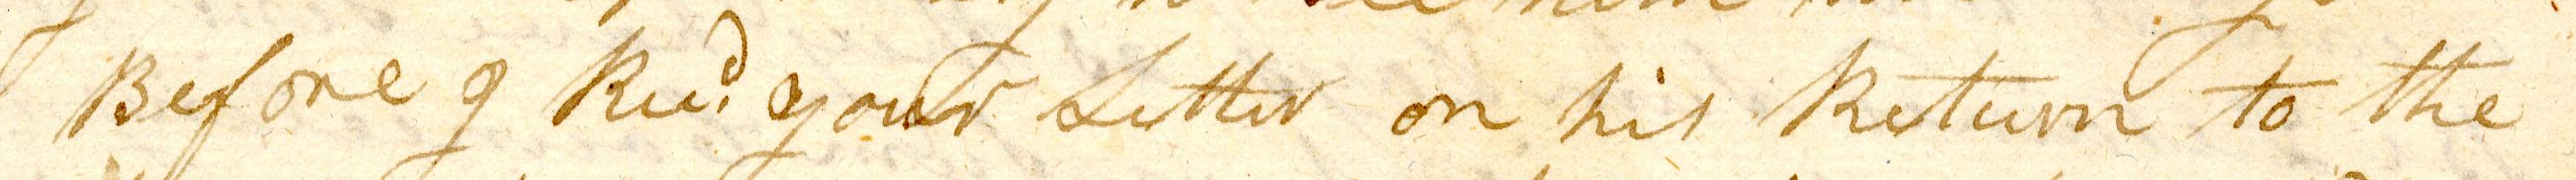Before I Reed your Letter on his Return to the
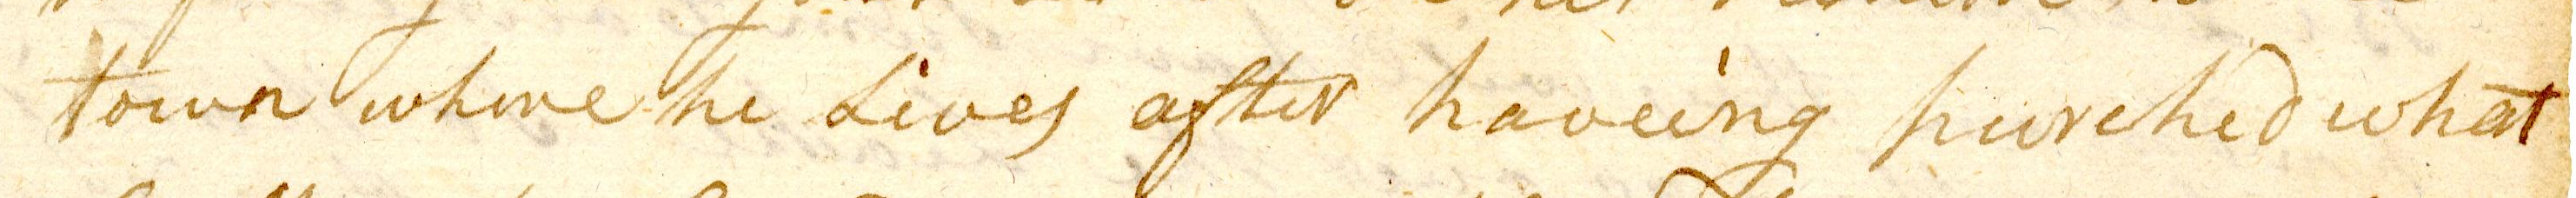town where he Lives after haveing purched what
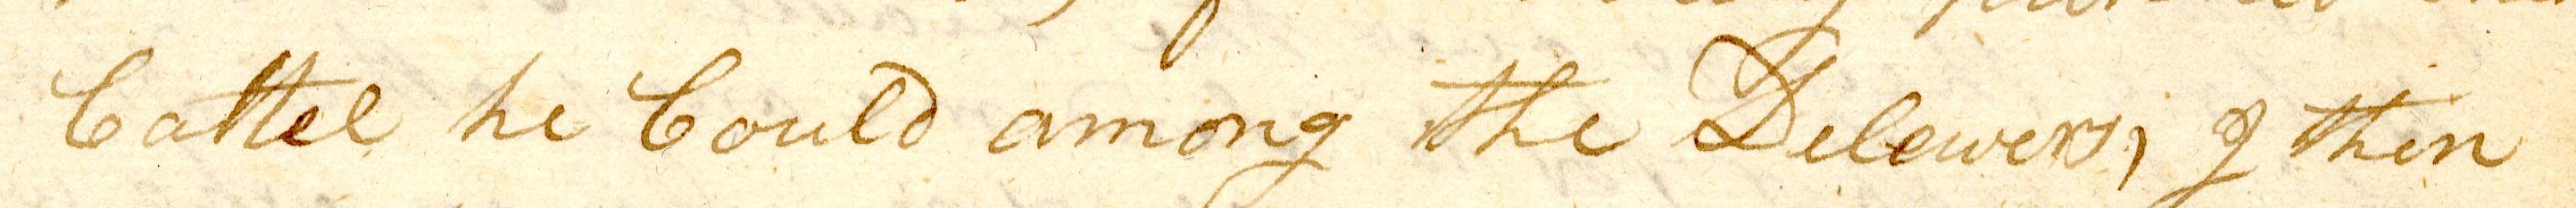Cattel he Could among the Delewers, I then
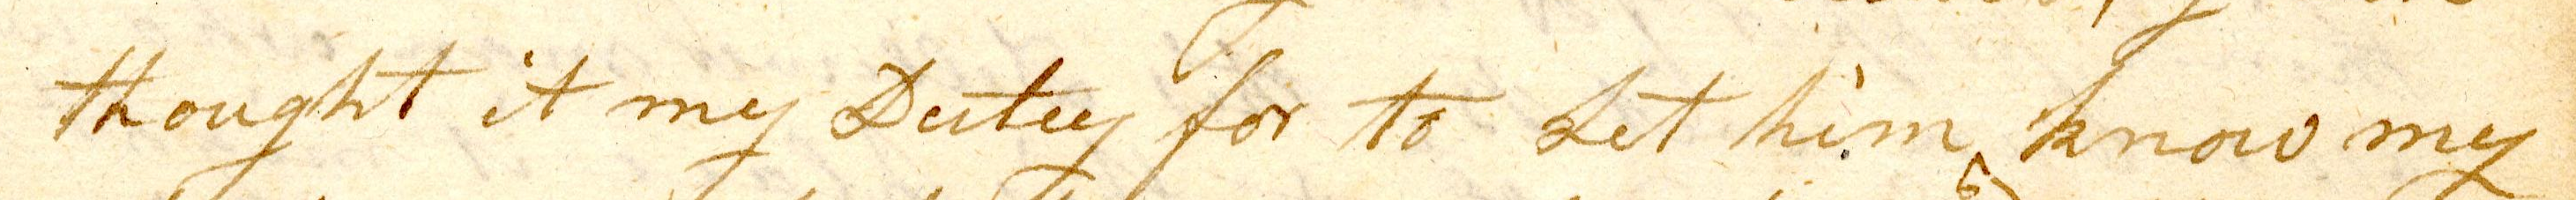thought it my Dutey for to Let him know my
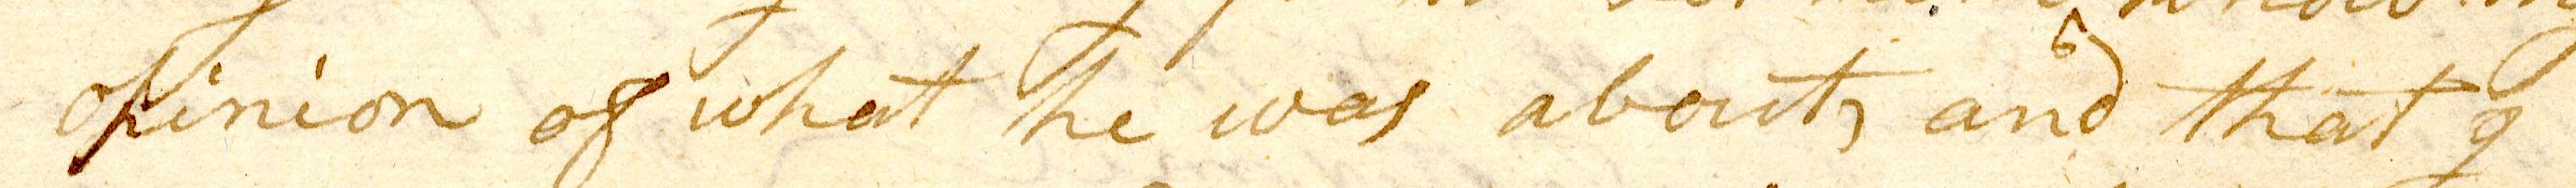opinion of what he was about, and that I
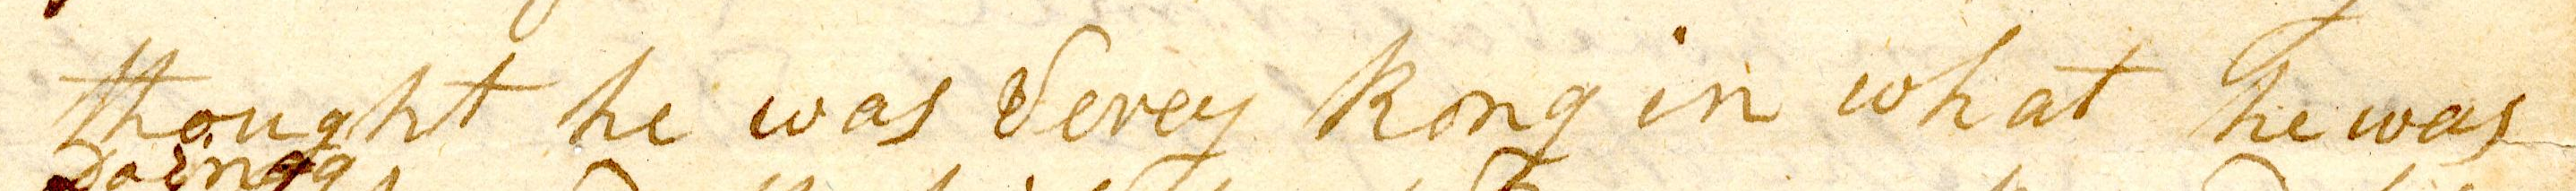thought he was verey Rong in what he was
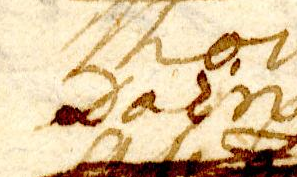Doing
